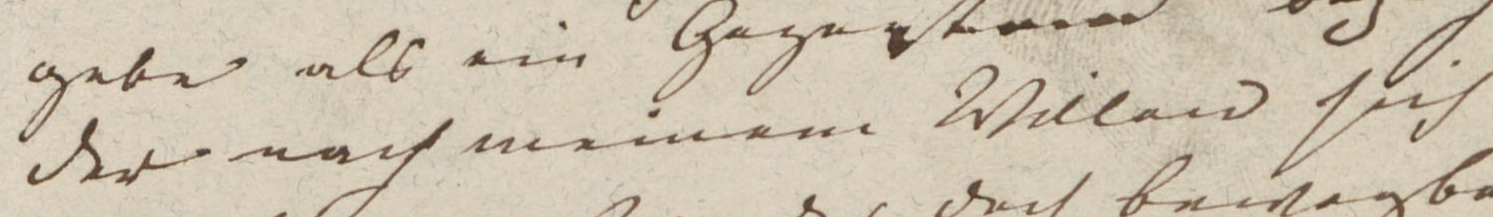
der nach meinem Willen sich
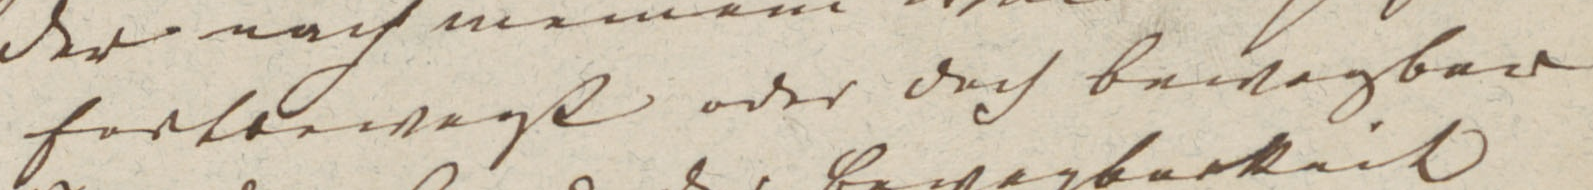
fortbewegt oder doch bewegbar
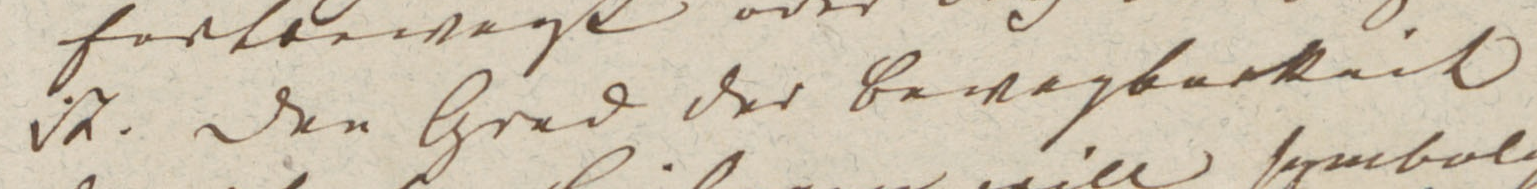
ist. Den Grad der Bewegbarkeit
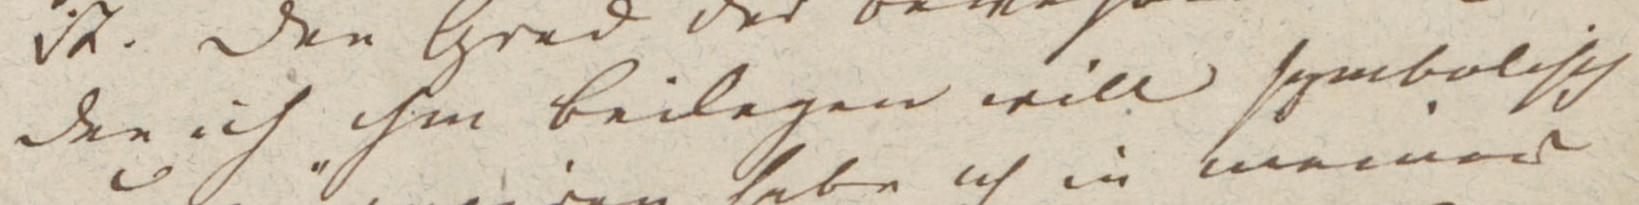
den ich ihm beilegen will symbolisch
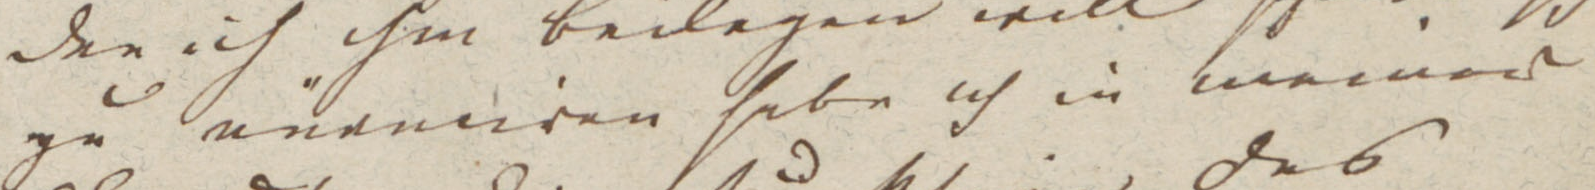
zu nüanciren habe ich in meiner
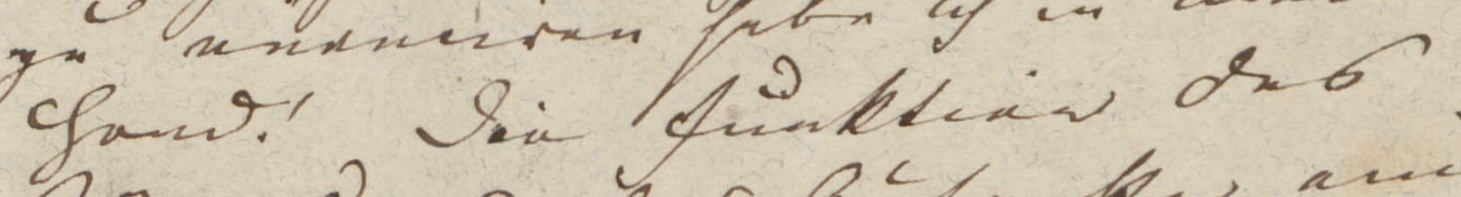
Hand! Die Funktion des
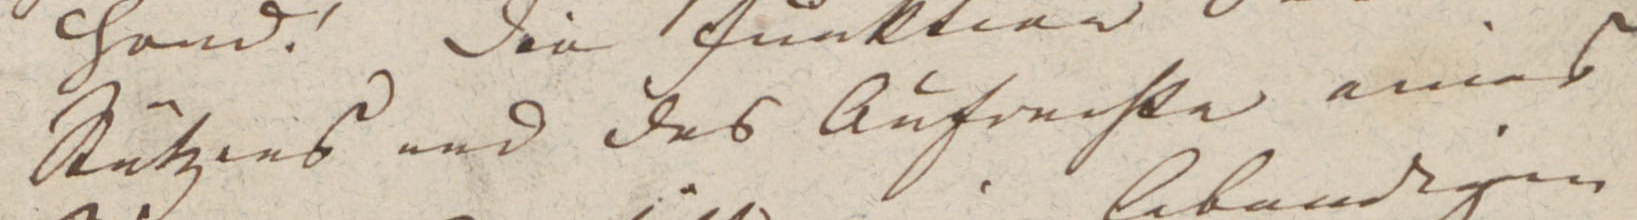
Stützens und das Aufrechte eines
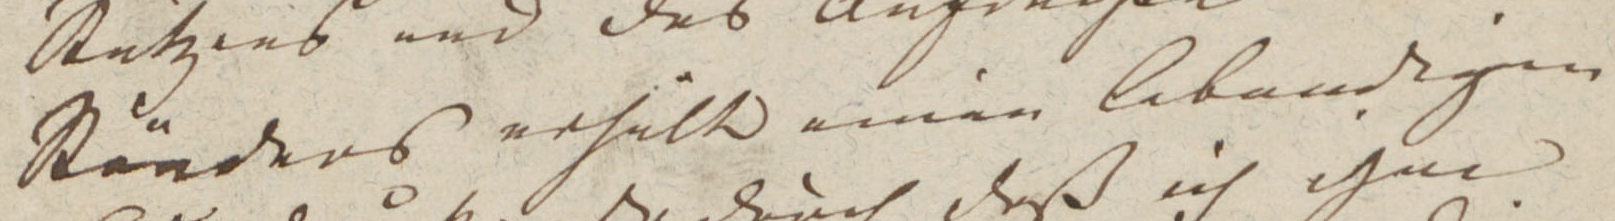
Ständers erhält einen lebendigen
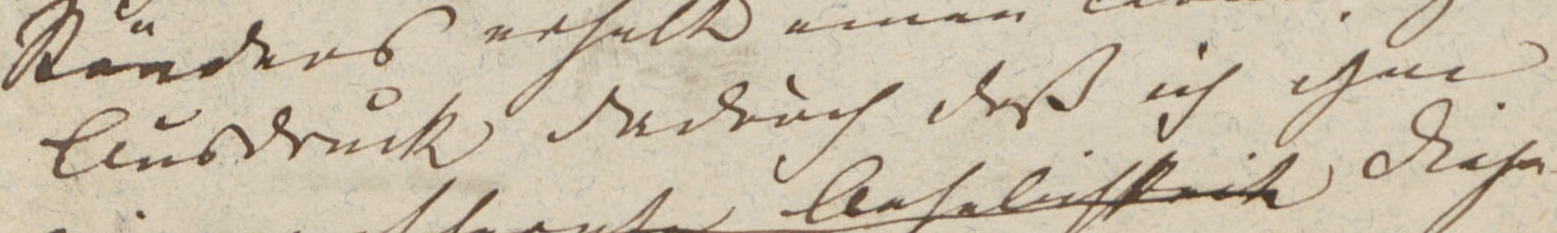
Ausdruck dadurch dass ich ihm
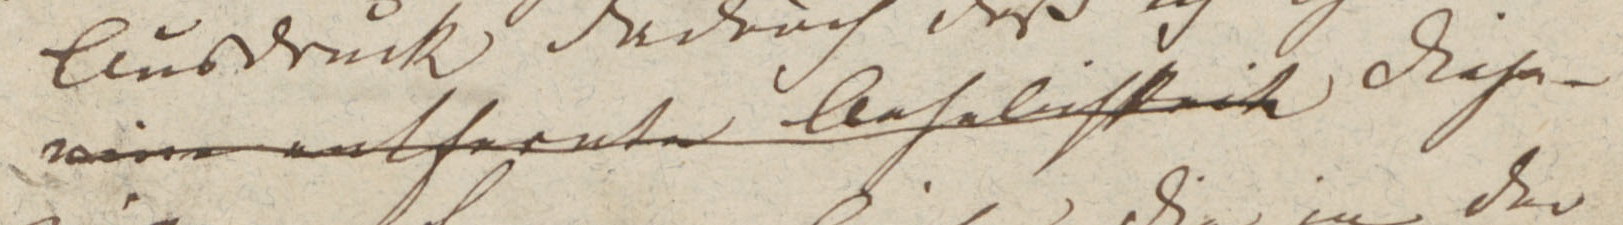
eine entfernte Aehnlichkeit dieje-
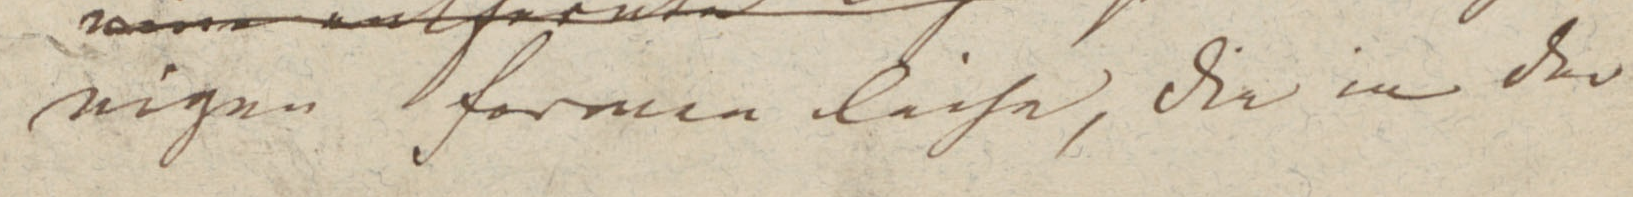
nigen Formen leihe, die in der
